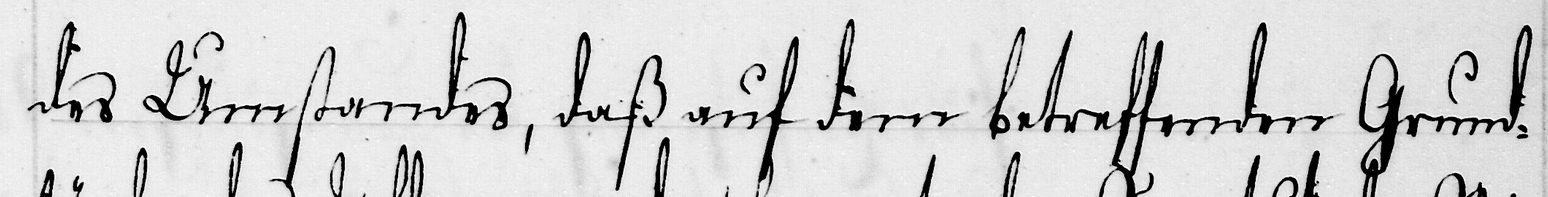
des Umstandes, daß auf dem betreffenden Grund¬
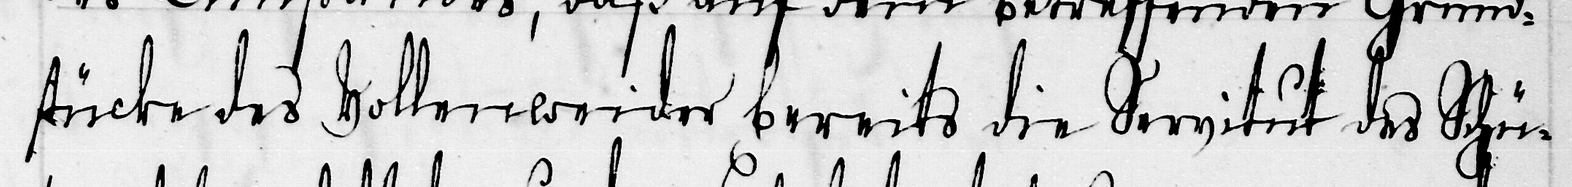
stücke des Vollenweider bereits die Servitut des Schüt¬
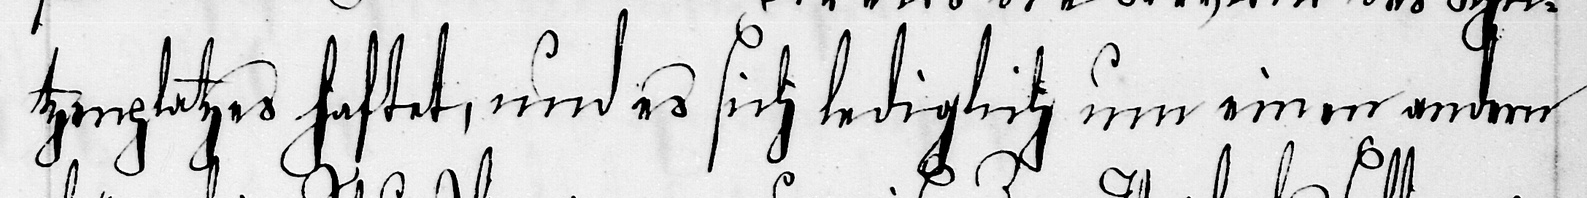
zenplatzes haftet, und es sich lediglich um einen andern
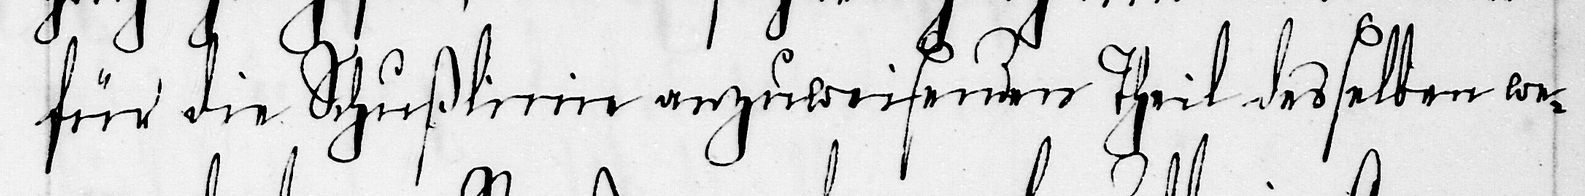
für die Schußlinie anzuweisenden Theil desselben we¬
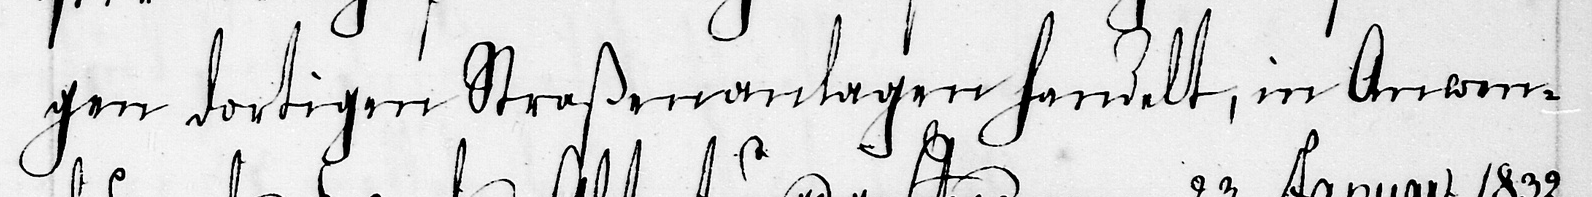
gen dortigen Straßenanlagen handelt, in Anwen¬
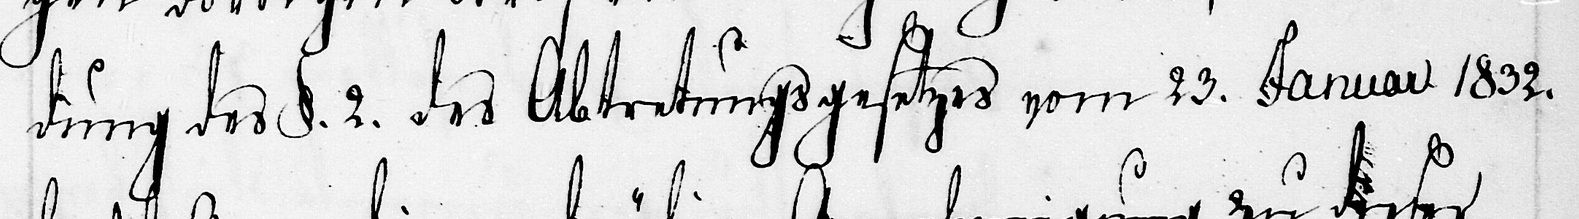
dung des §. 2. des Abtretungsgesetzes vom 23. Januar 1832.
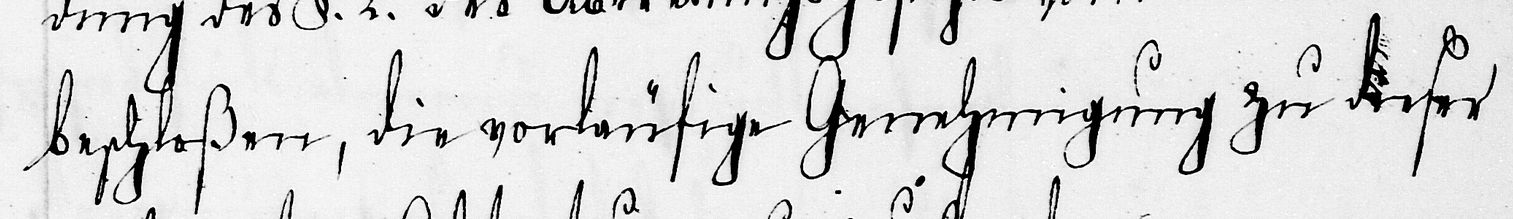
beschloßen, die vorläufige Genehmigung zu dieser
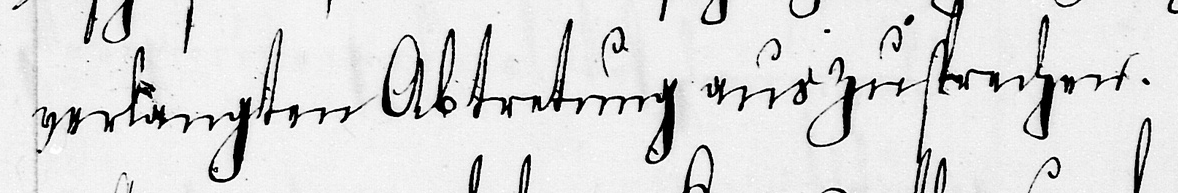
verlangten Abtretung auszusprechen,
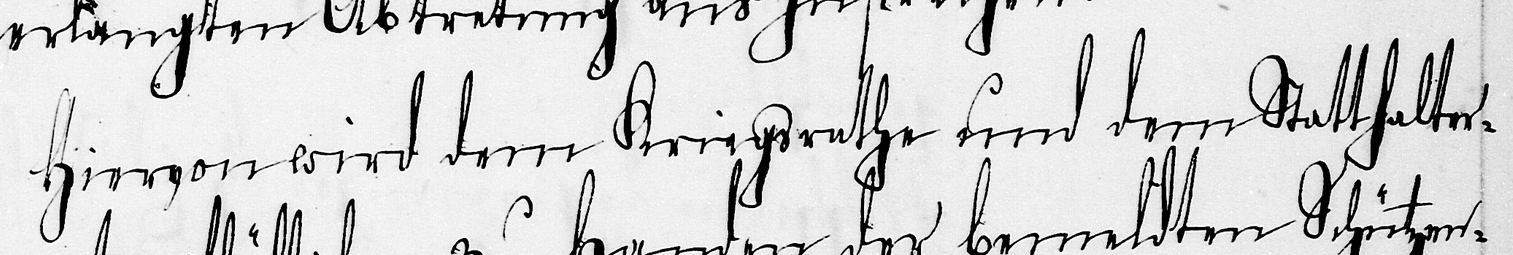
Hiervon wird dem Kriegsrathe und dem Statthalte¬
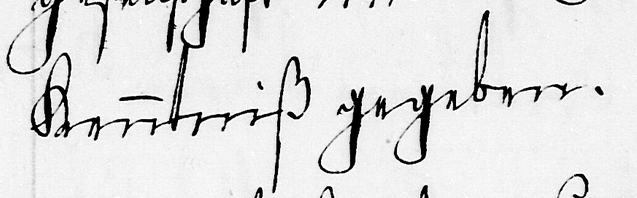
Kenntniß gegeben.
